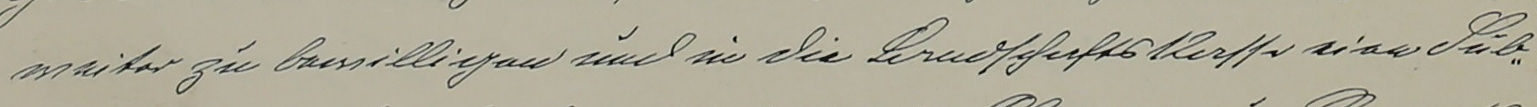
weiter zu bewilligen und in die Landschaftskasse eine Sub-
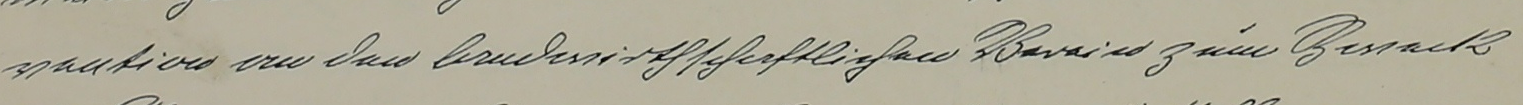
vention an den landwirtschaftlichen Verein zum Zweck
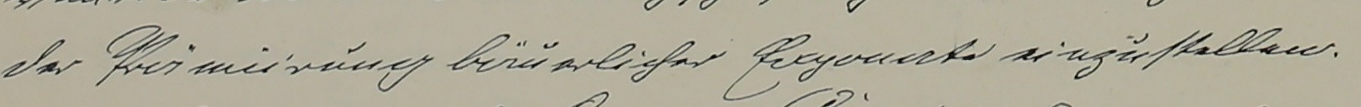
der Prämiirung bäuerlicher Exponate einzustellen.
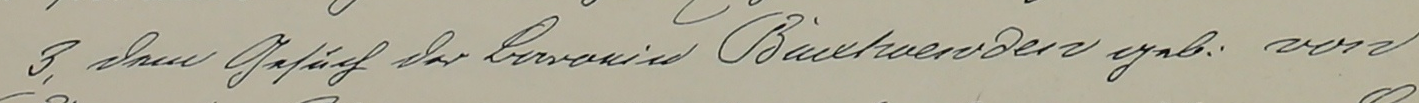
3. Dem Gesuch der Baronin Buxhoewden, geb. von
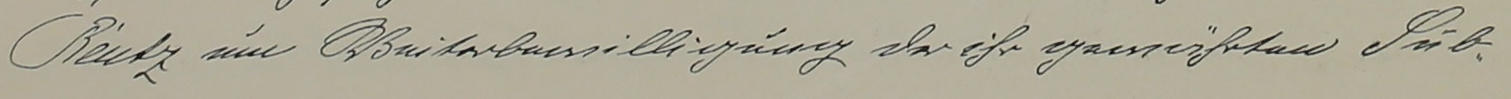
Reutz um Weiterbewilligung der ihr gewährten Sub-
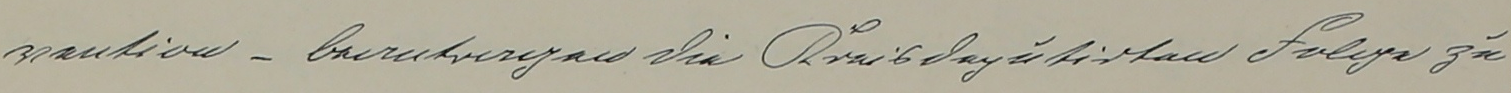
vention - beantragen die Kreisdeputirten Folge zu
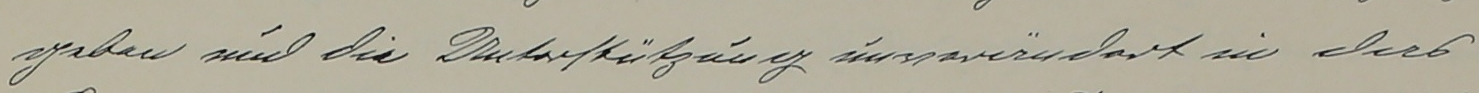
geben und die Unterstützung unverändert in das
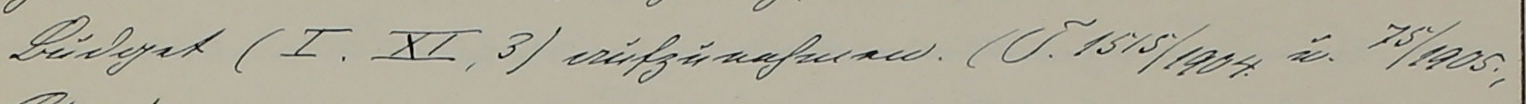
Budget (I. XI,3) aufzunehmen. (T.1515/1904. u. 75/1905;
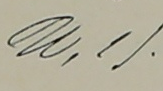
U.1).
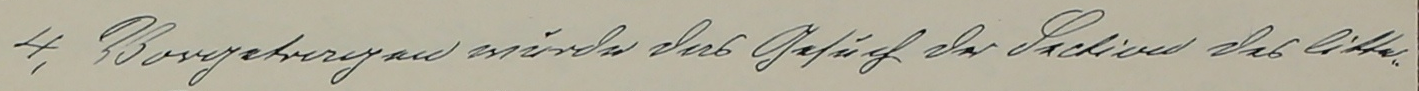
4. Vorgetragen wurde das Gesuch der Section des litte-
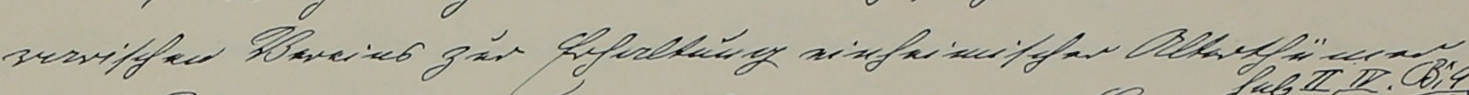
rarischen Vereins zur Erhaltung einheimischer Alterthümer
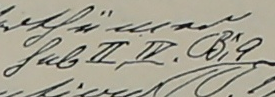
sub II, IV, B.9
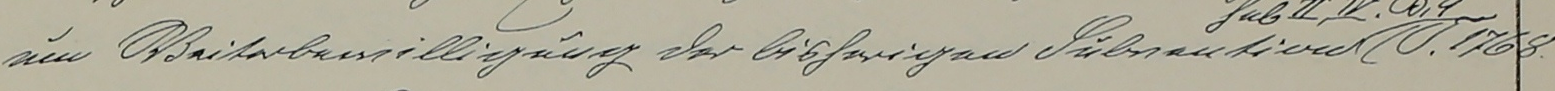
um Weiterbewilligung der bisherigen Subvention (T.1768.
